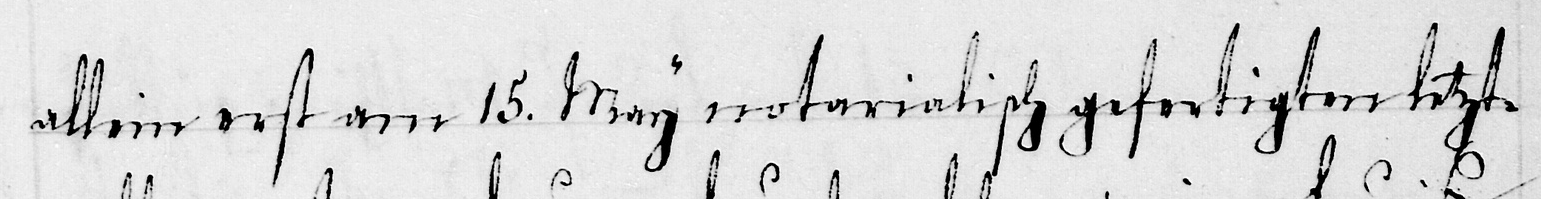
allein erst am 15. May notarialisch gefertigten letzt¬
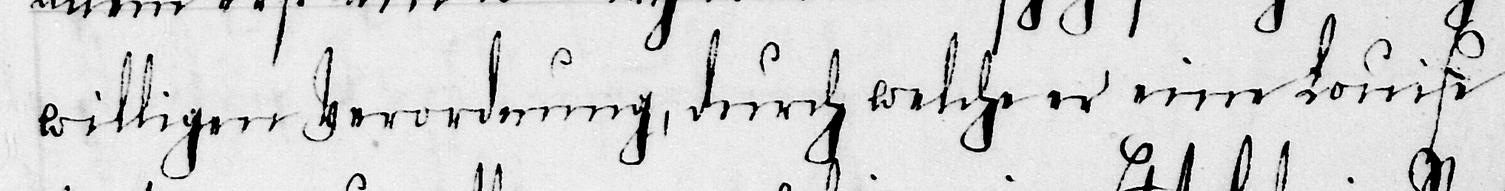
willigen Verordnung, durch welche er eine Louise
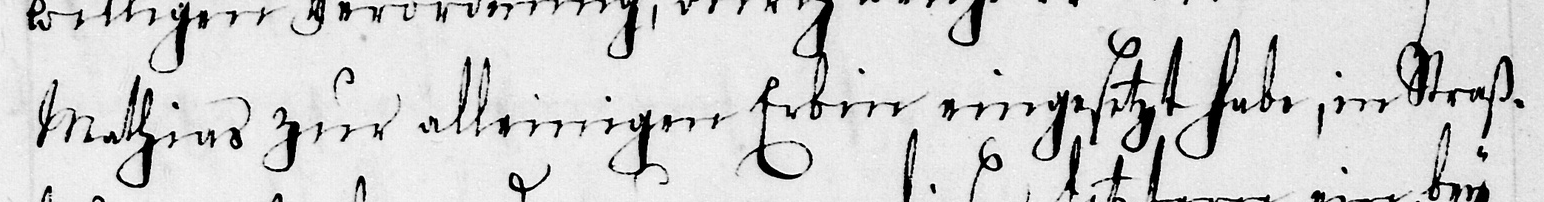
Mathias zur alleinigen Erbin eingesetzt habe, in Straß¬
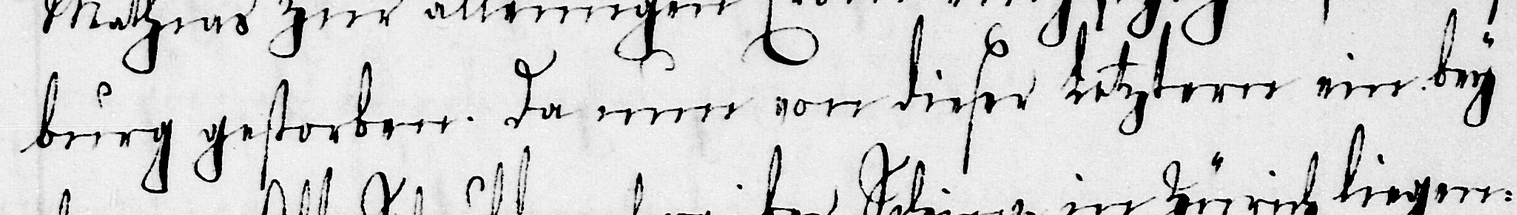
burg gestorben. Da nun von dieser Letztern ein bey
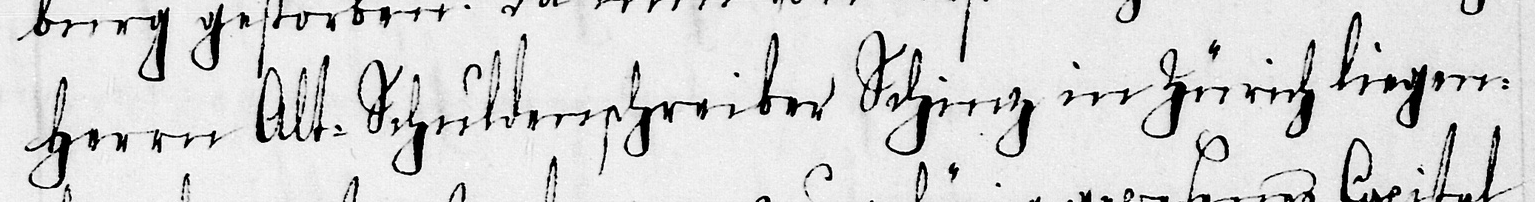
Herrn Alt-Schuldenschreiber Schinz in Zürich liegen¬
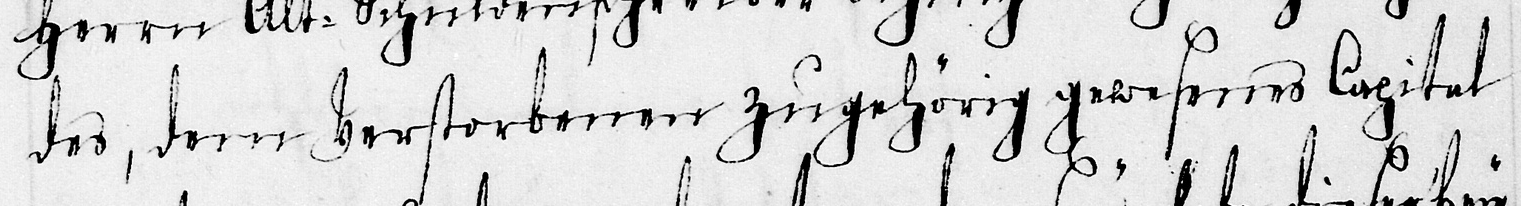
des, dem Verstorbenen zugehörig gewesenes Capital
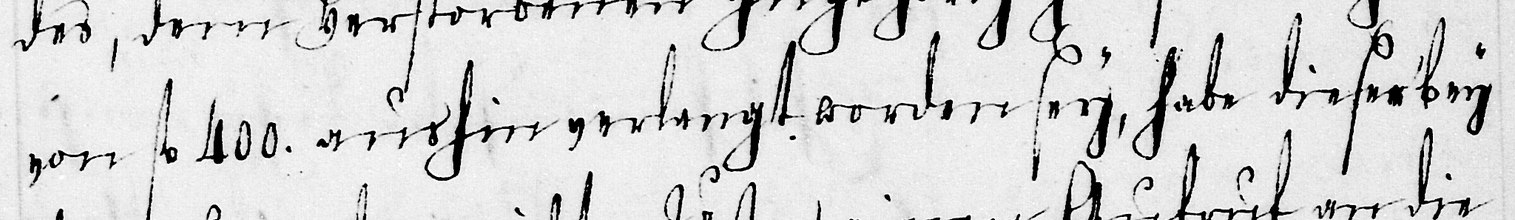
von fl. 400. aushinverlangt worden sey, habe dieser bey
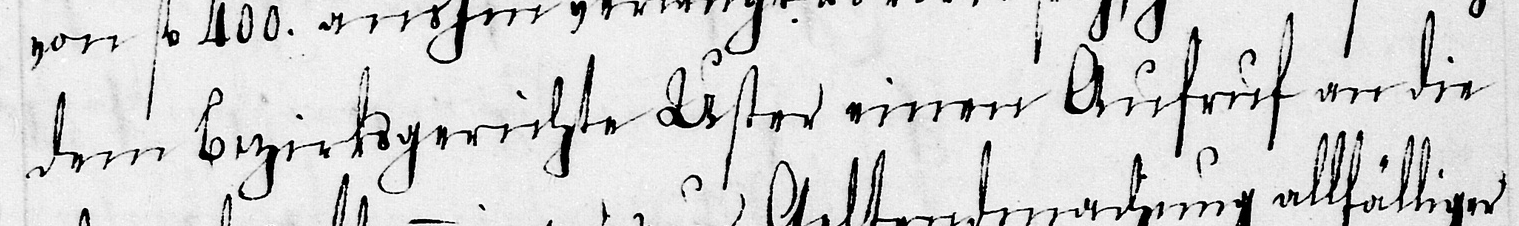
dem Bezirksgerichte Uster einen Aufruf an die
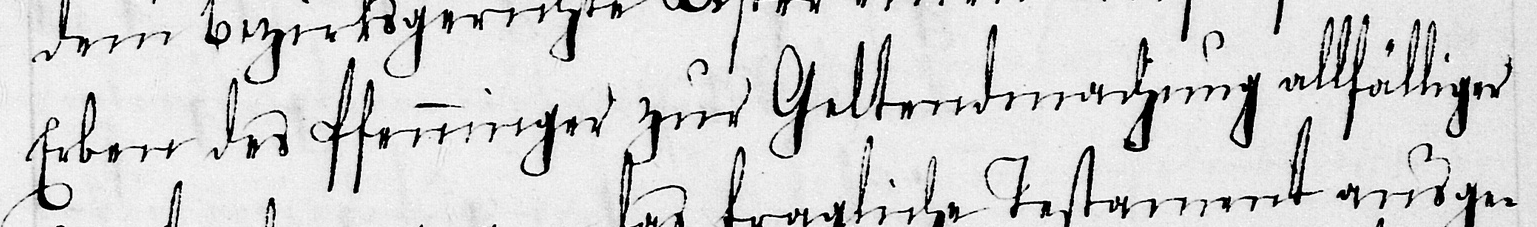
Erben des Pfenninger zur Geltendmachung allfälliger
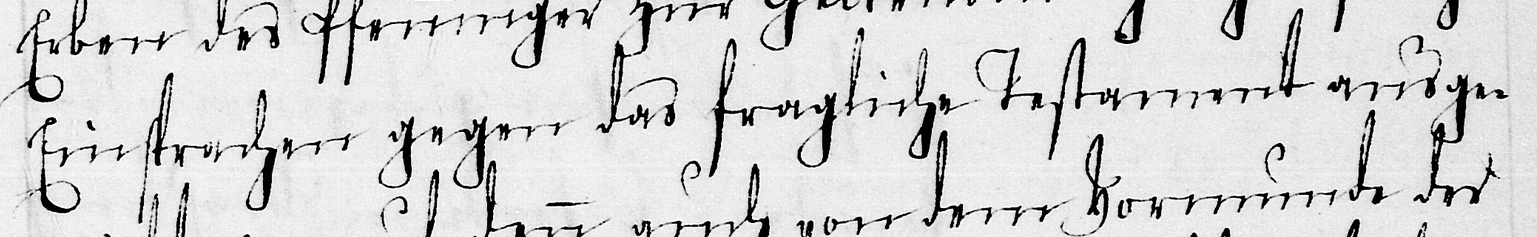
Einsprachen gegen das fragliche Testament ausge¬
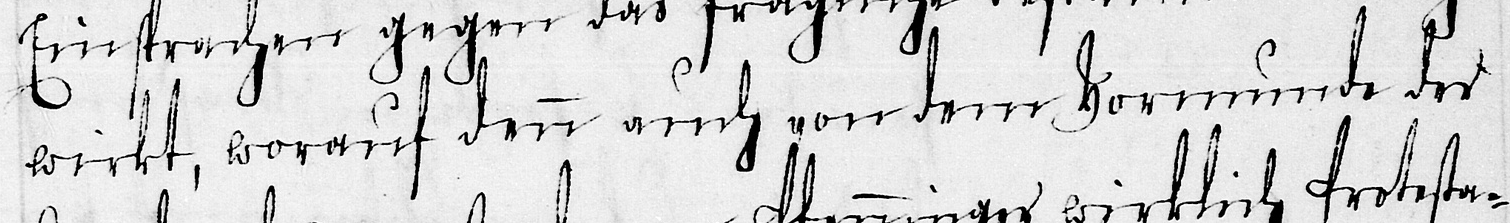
wirkt, worauf denn auch von dem Vormunde der
